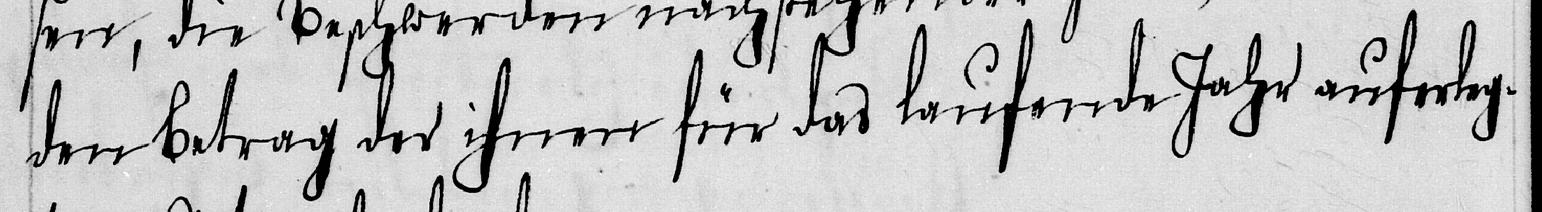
den Betrag der ihnen für das laufende Jahr auferleg¬
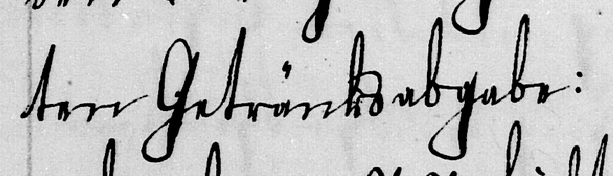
ten Getränksabgabe:
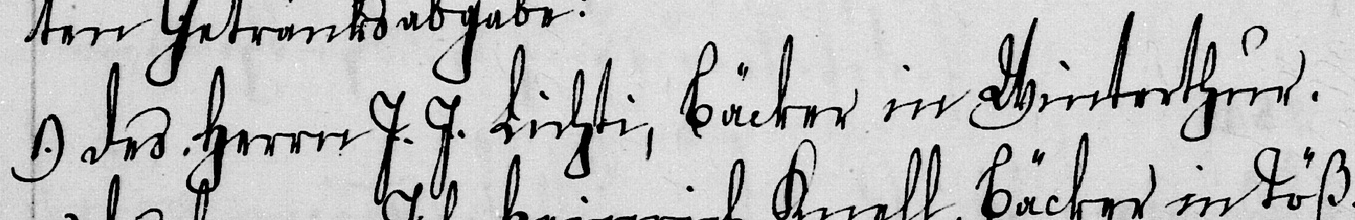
1.) des Herrn J.J. Lichti, Bäcker in WInterthur.
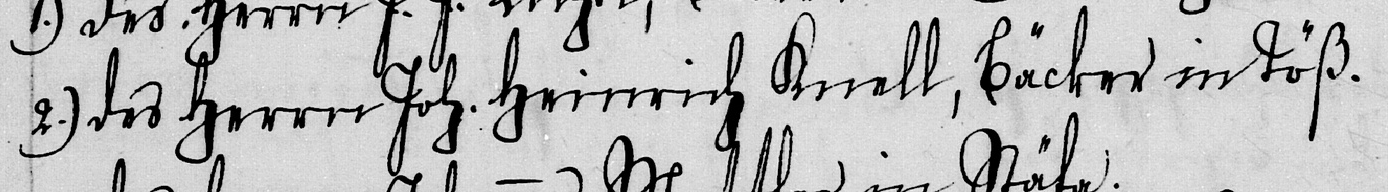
2.) des Herrn Joh. Heinrich Knell, Bäcker in Töß.
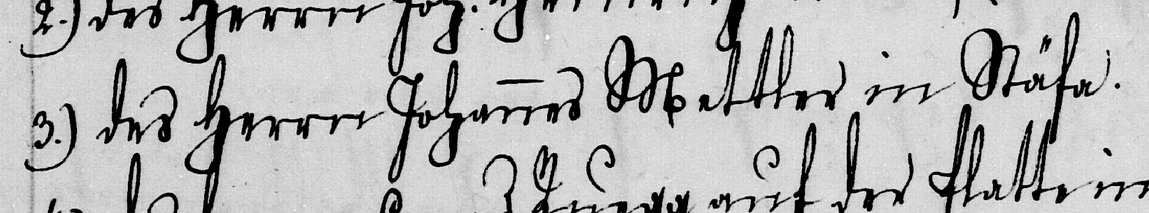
3.) des Herrn Johannes Mettler in Stäfa.
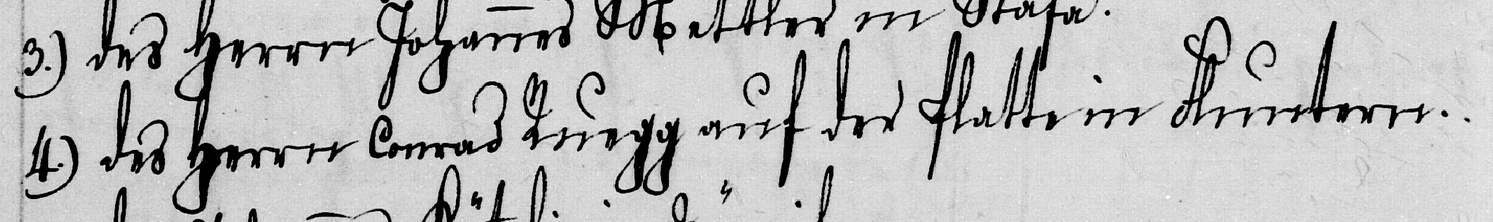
4.) des Herrn Conrad Ruegg auf der Platte in Fluntern.
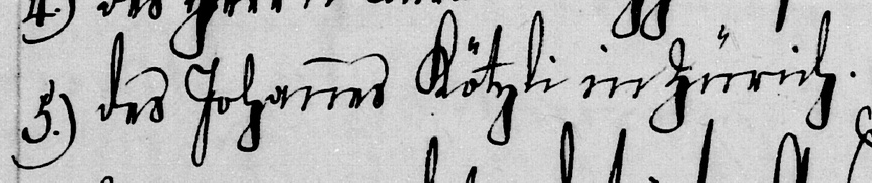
5.) des Johannes Kötzli in Zürich.
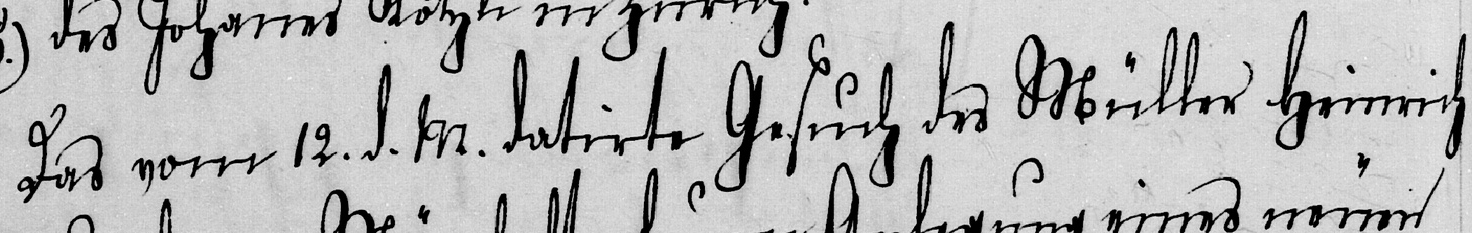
Das vom 12. d. M. datirte Gesuch des Müller Hein¬
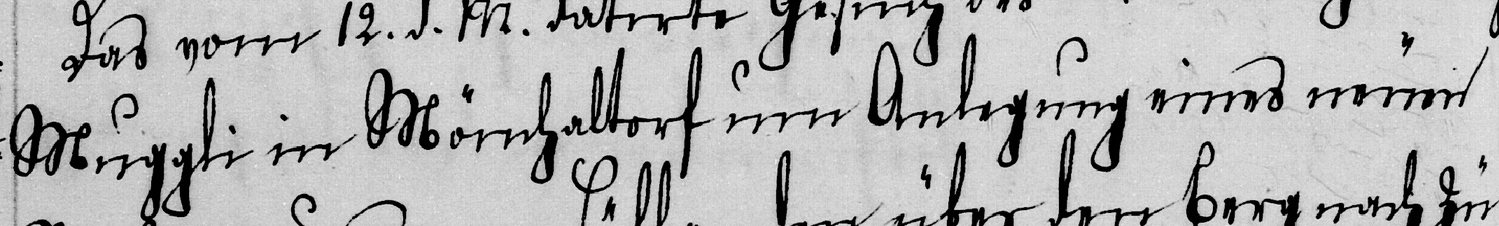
Muggli in Mönchaltorf um Anlegung eines neuen
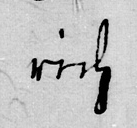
rich
